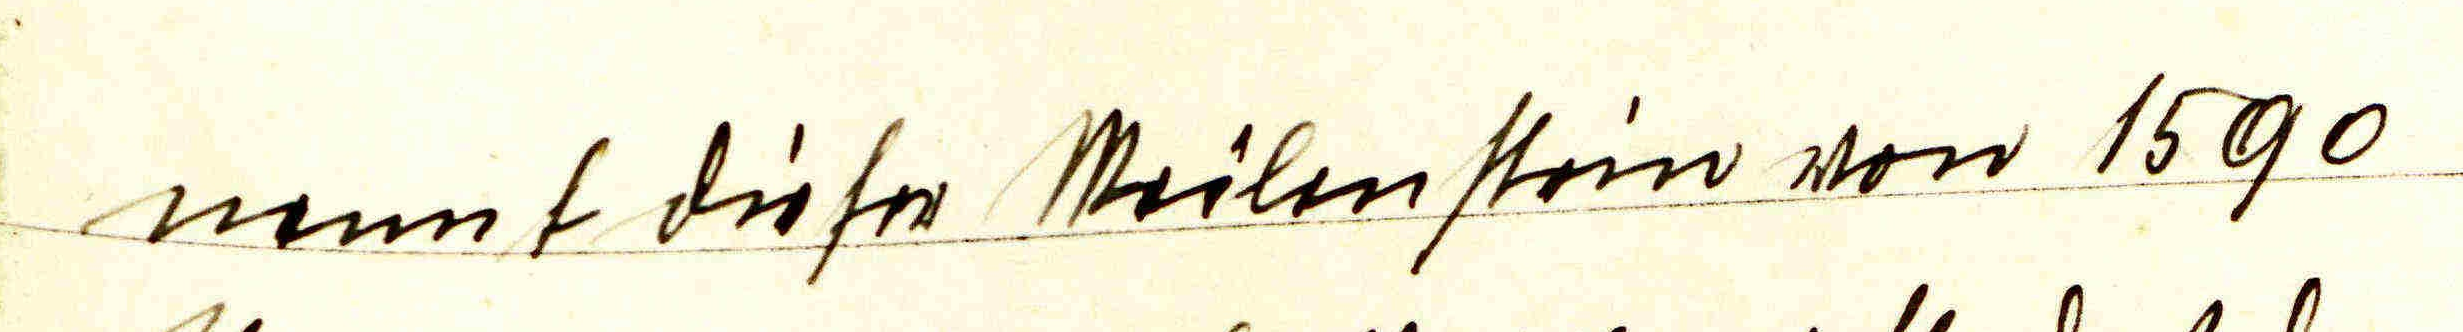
nennt dieser Meilenstein von 1590
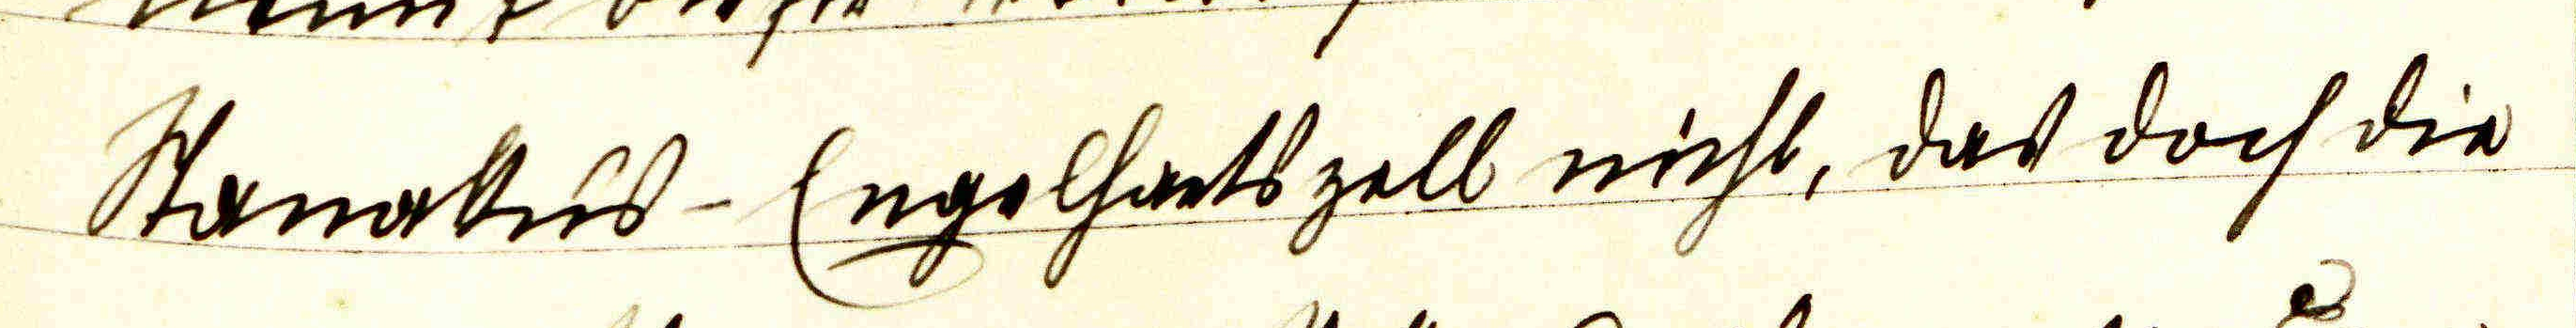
Stanakus-Engelhartszell nicht, das doch die
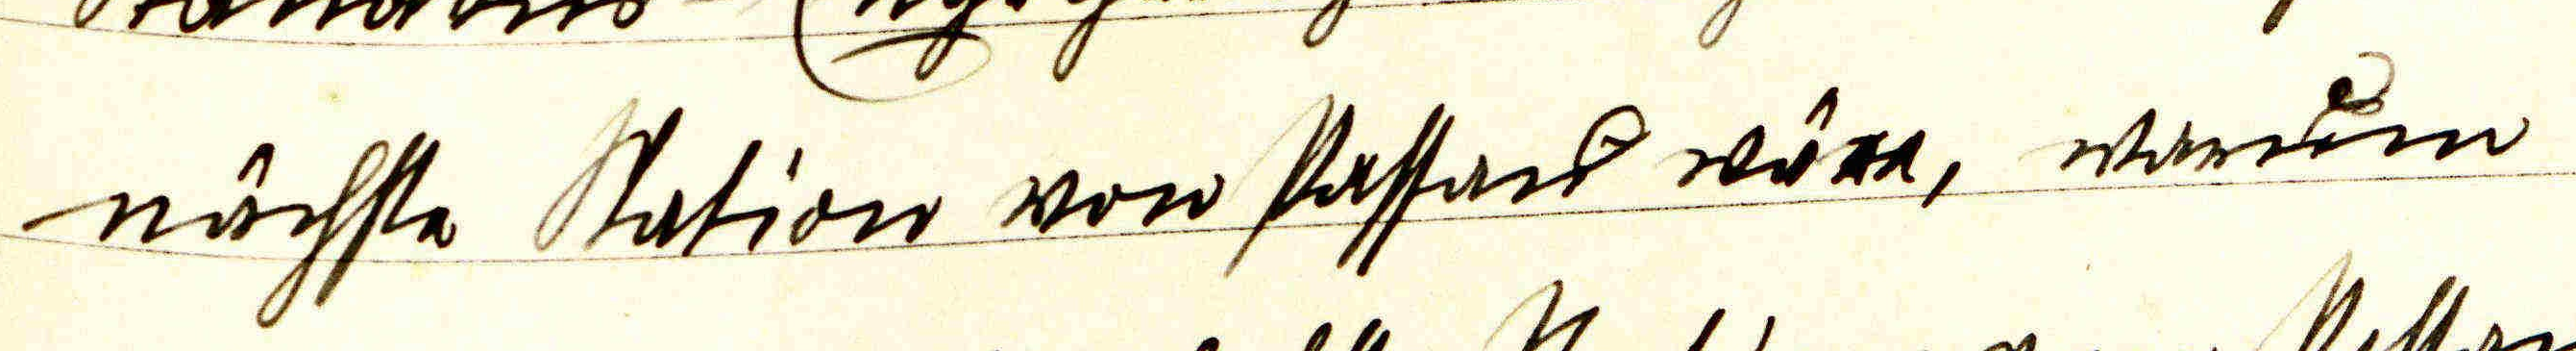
nächste Station von Passau wäre, warum
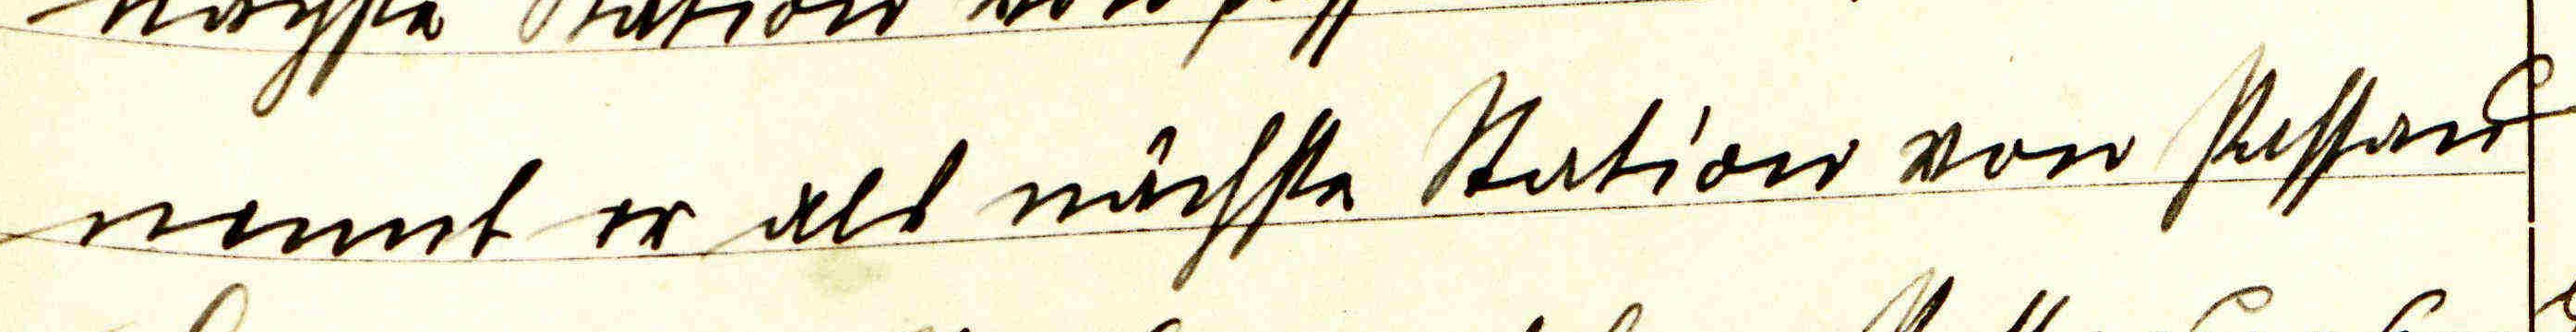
nennt er als nächste Station von Passau-
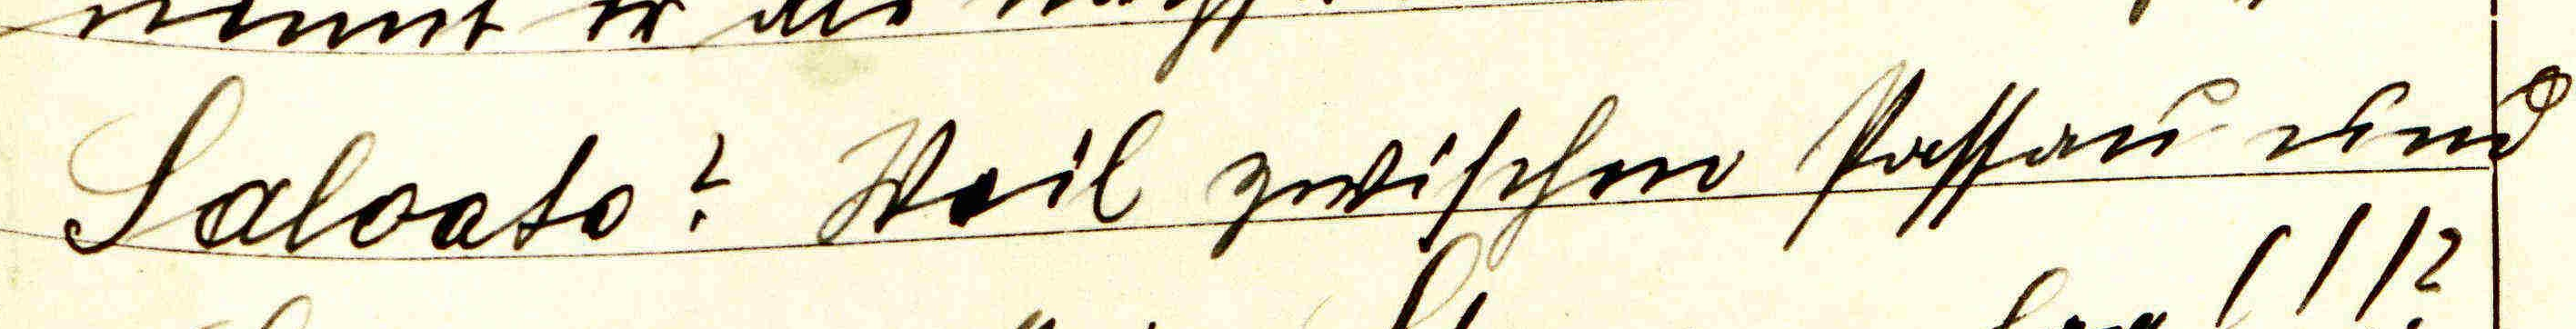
Saloato? Weil zwischen Passau und
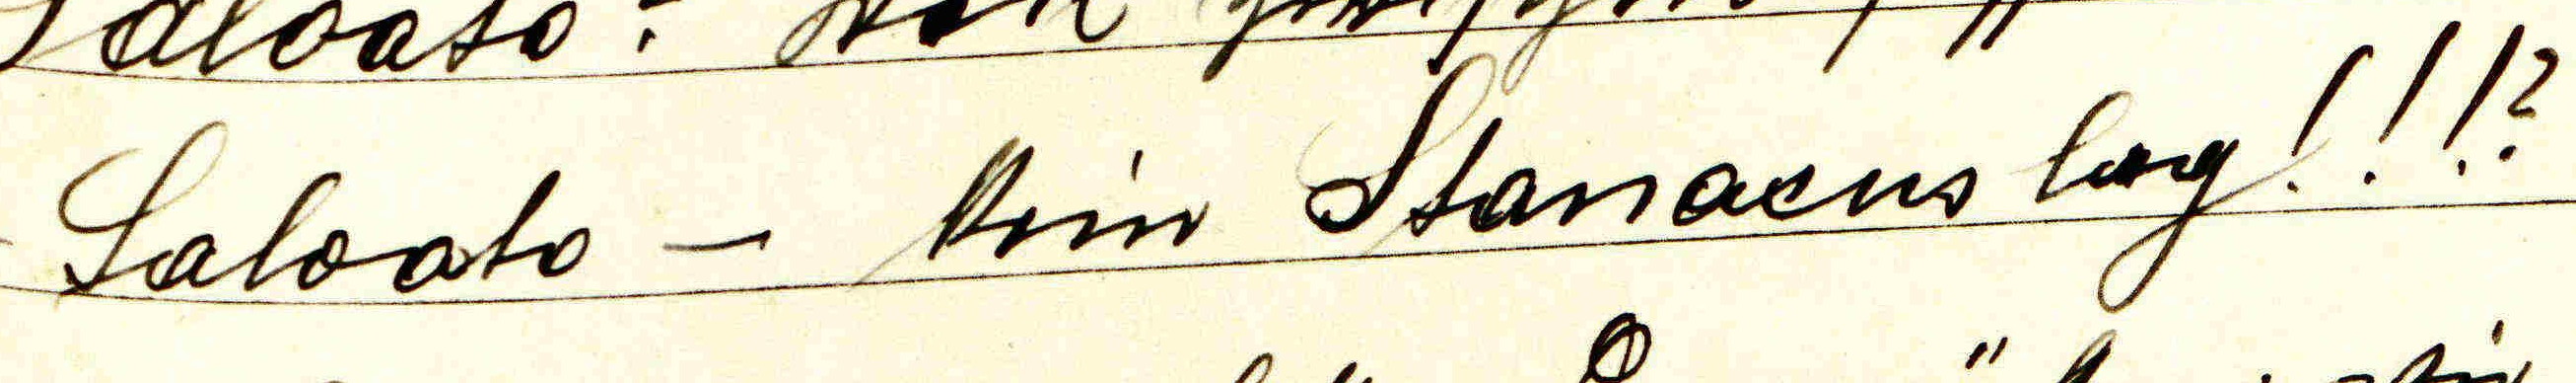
Saloato – kein Stanacus lag!!!?
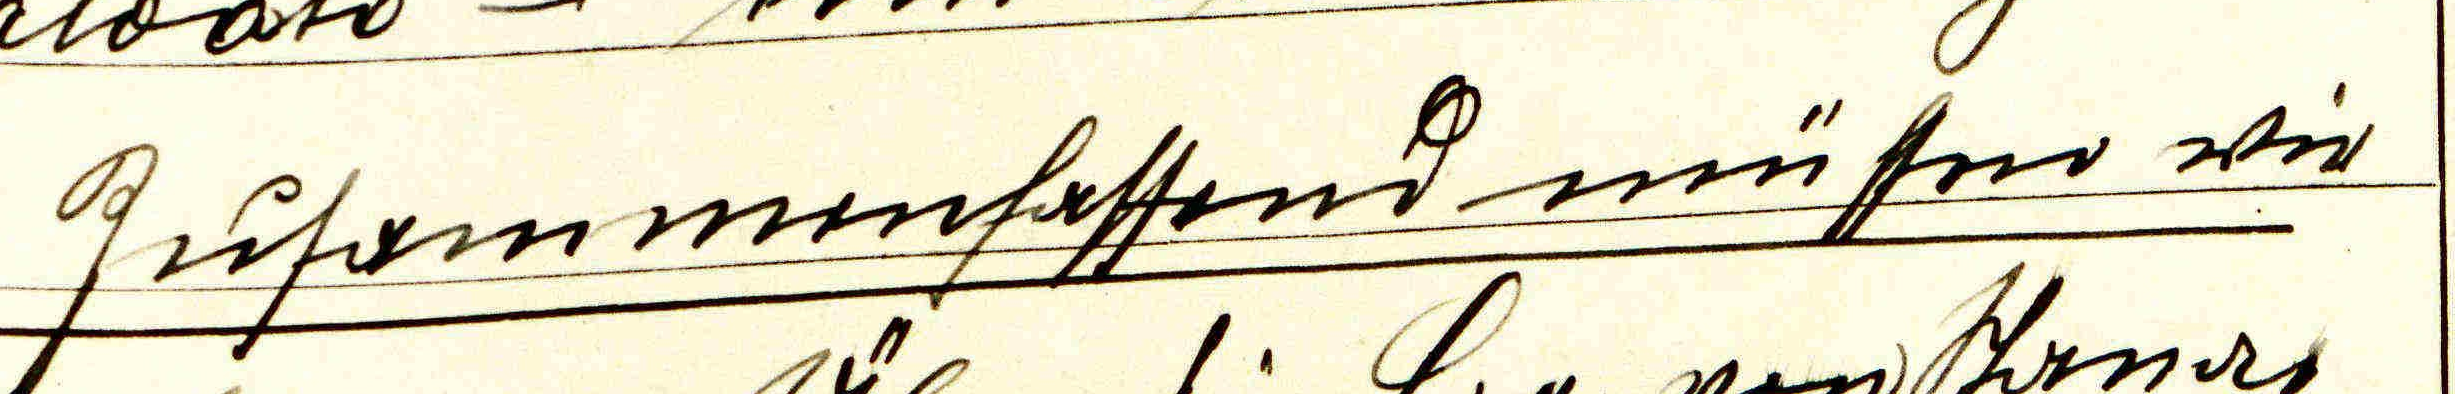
Zusammenfassend müssen wir
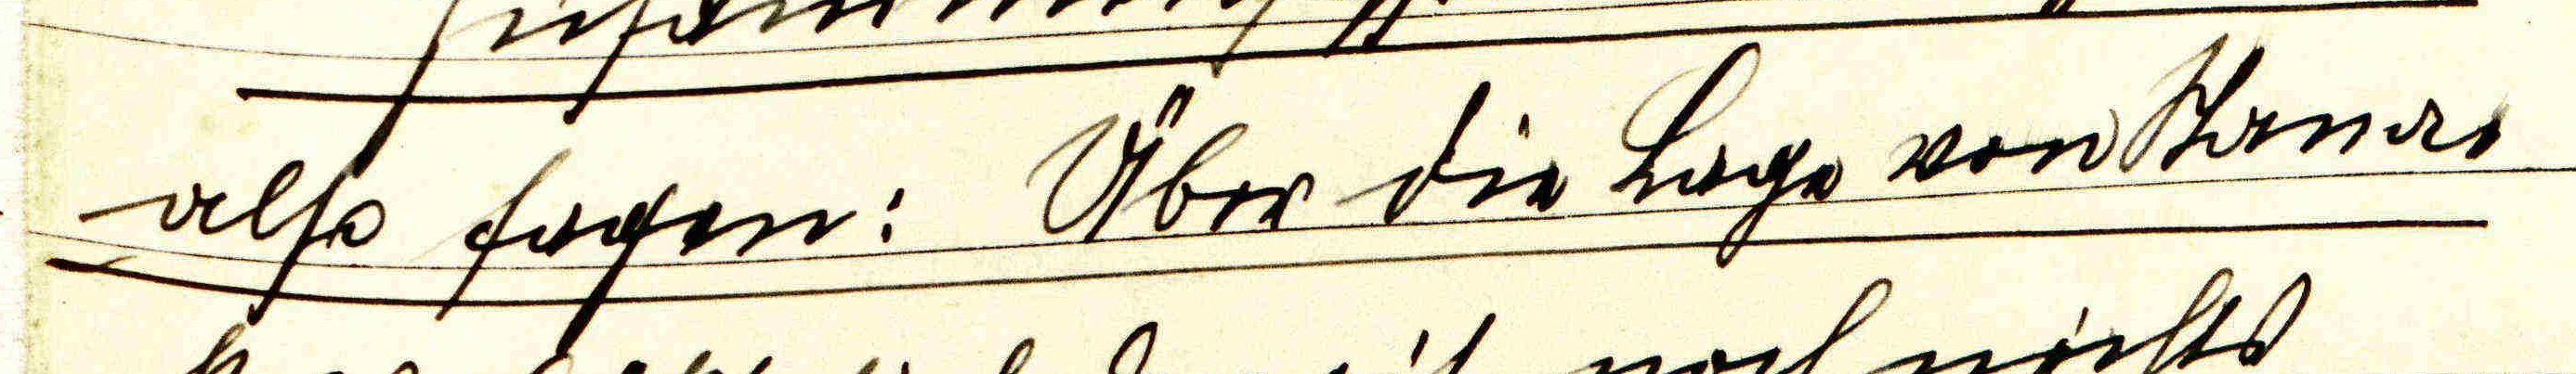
also sagen: Über die Lage von Stana-
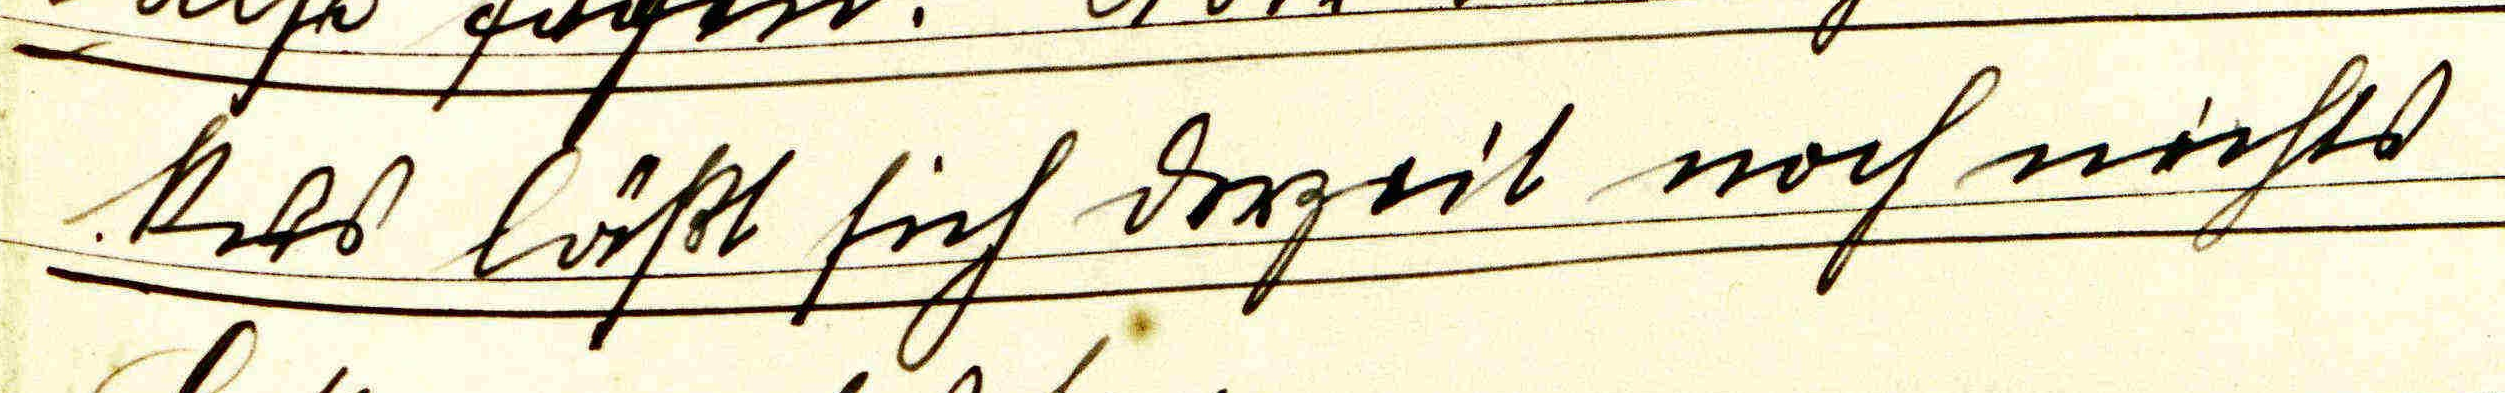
kus läßt sich derzeit noch nichts
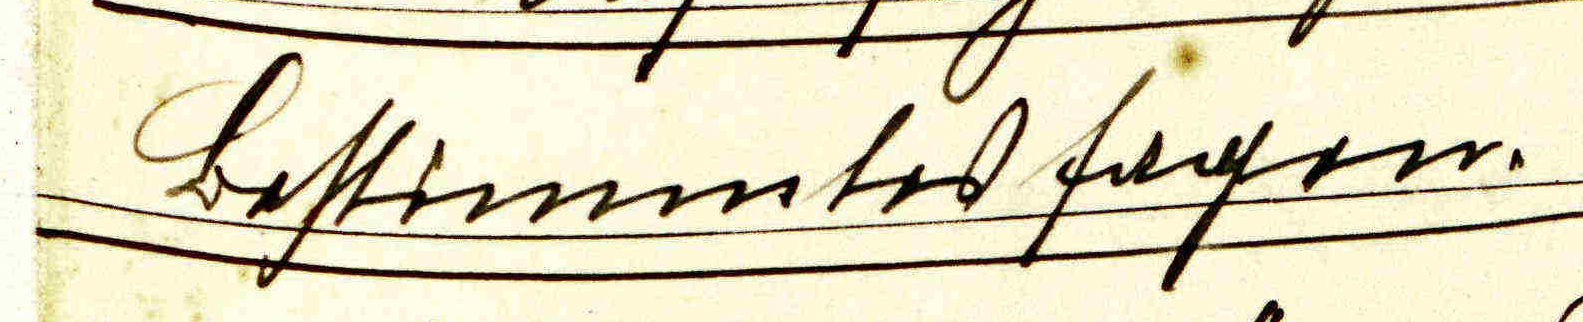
Bestimmtes sagen.
